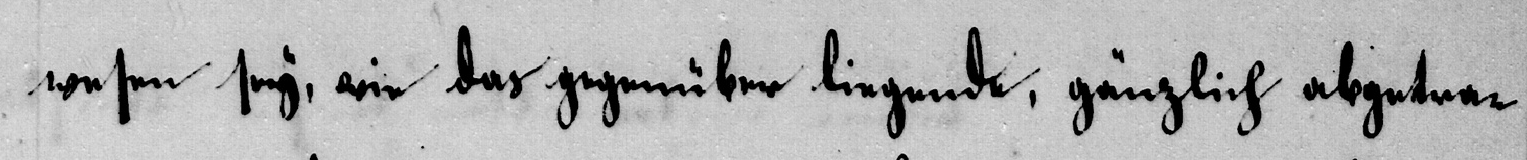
wesen sey, wie das gegenüber liegende, gänzlich abgetra¬
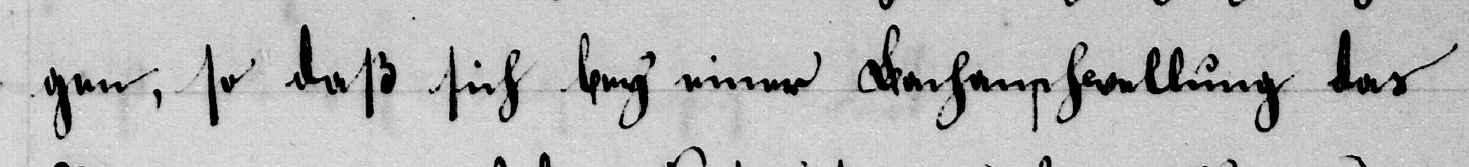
gen, so daß sich bey einer Bachanschwellung das
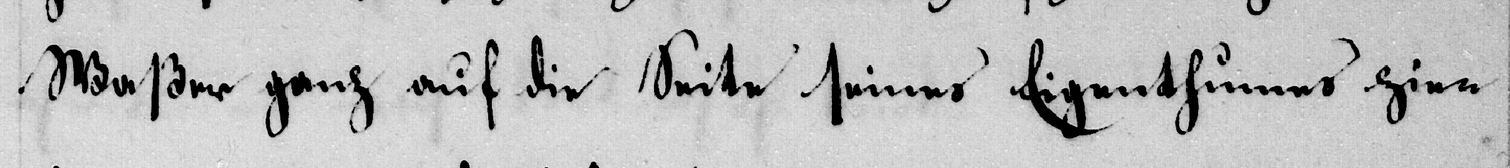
Waßer ganz auf die Seite seines Eigenthumes zie¬
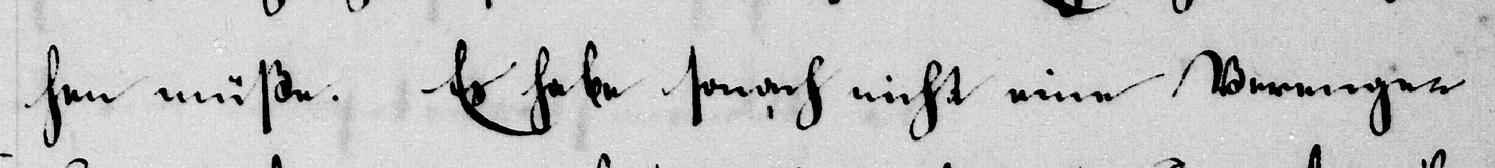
hen müße. Es habe sonach nicht eine Verenge¬
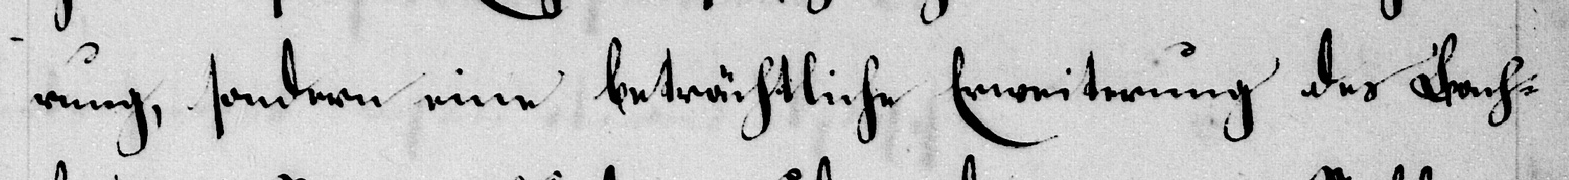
rung, sondern eine beträchtliche Erweiterung des Bach¬
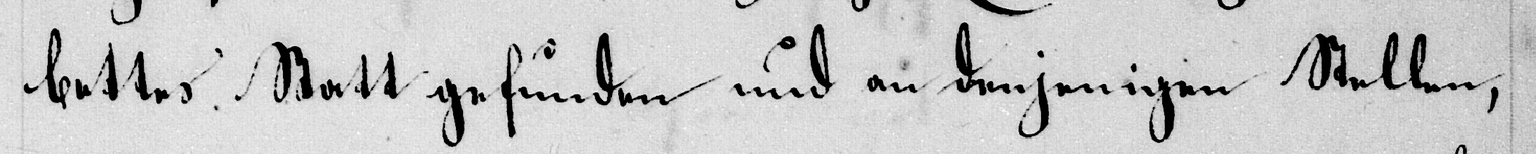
bettes Statt gefunden und an denjenigen Stellen,
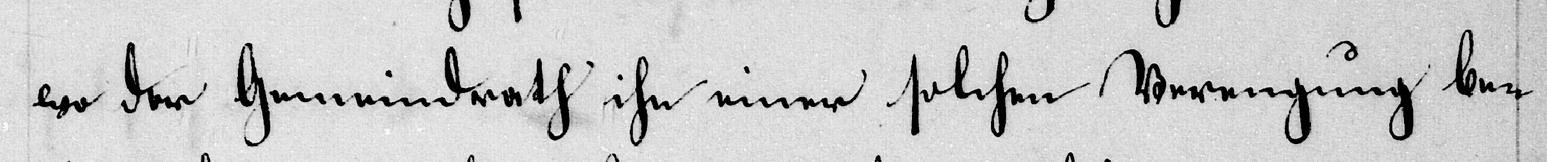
wo der Gemeindrath ihn einer solchen Verengung be¬
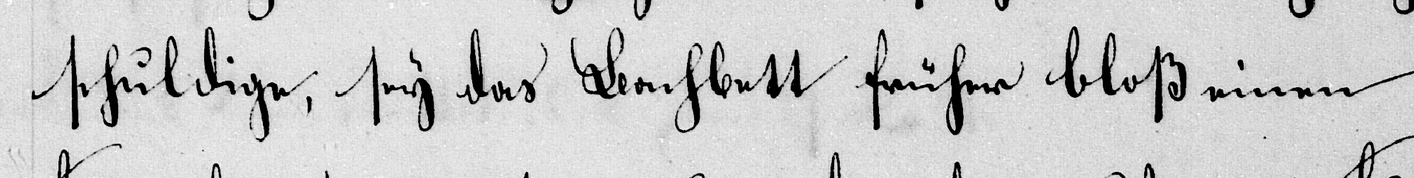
schuldige, sey das Bachbett früher bloß einen
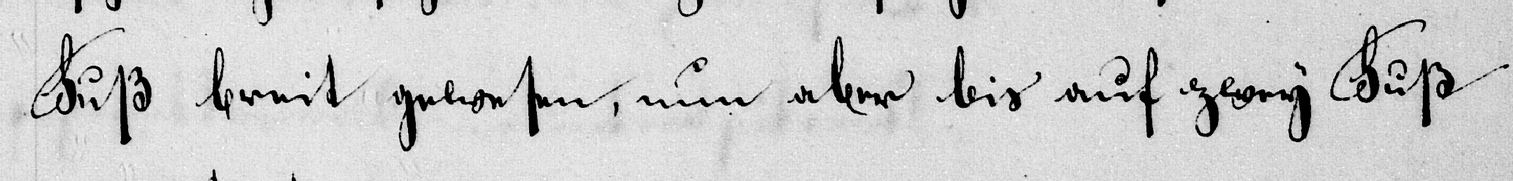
Fuß breit gewesen, nun aber auf zwey Fuß
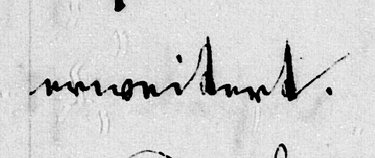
erweitert.
